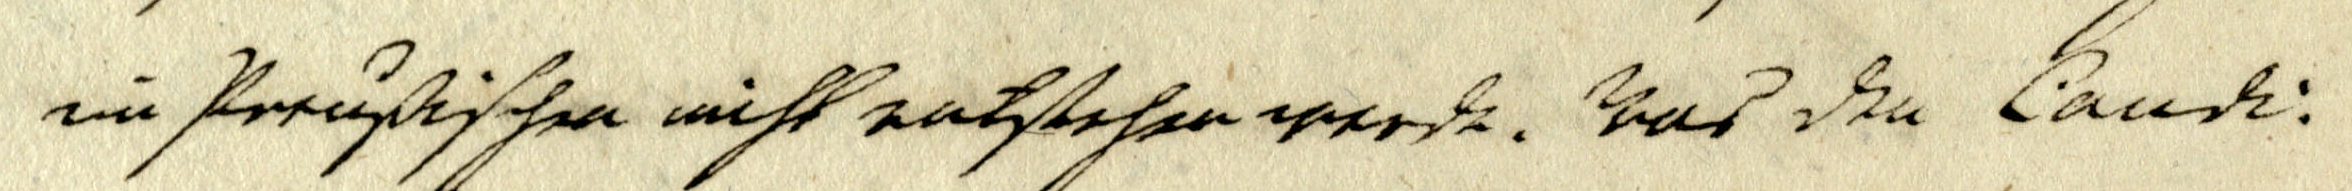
im Preußischen nicht entstehen werde. Was den Candi¬
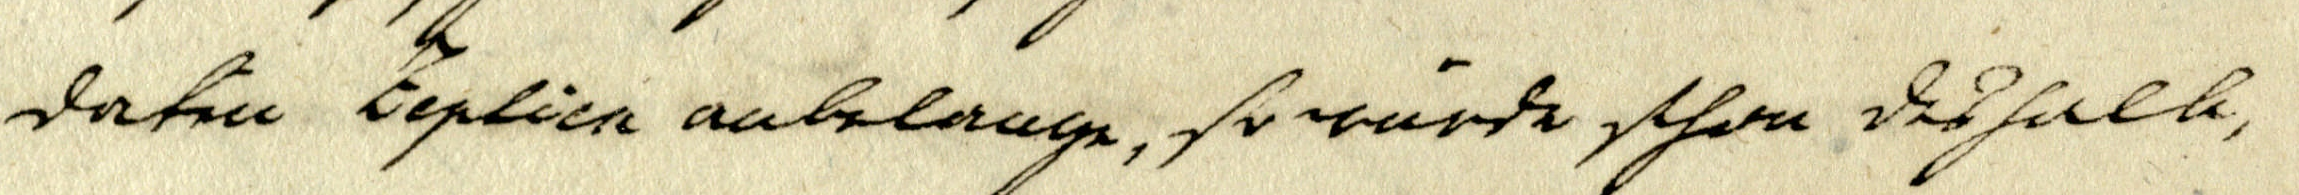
daten Zeplien anbelange, so würde schon deshalb,
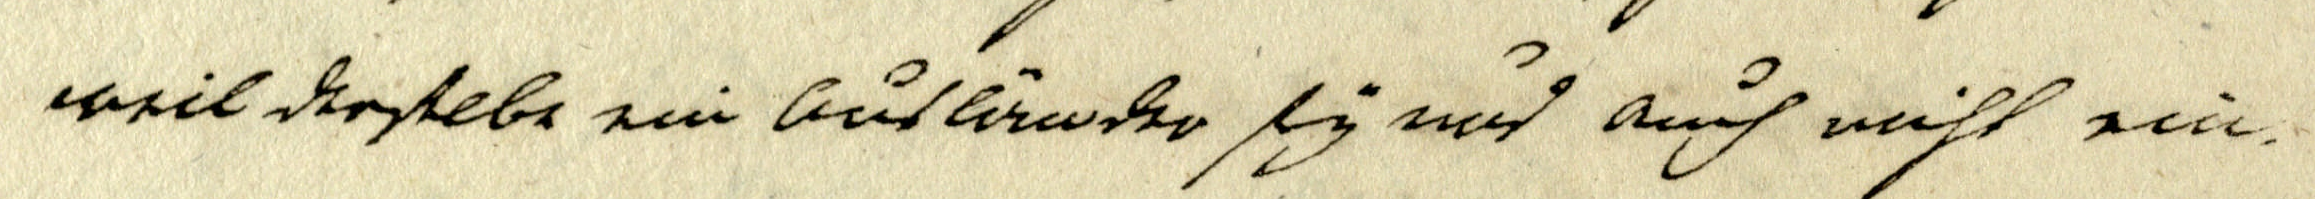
weil derselbe ein Ausländer seÿ und auch nicht ein¬
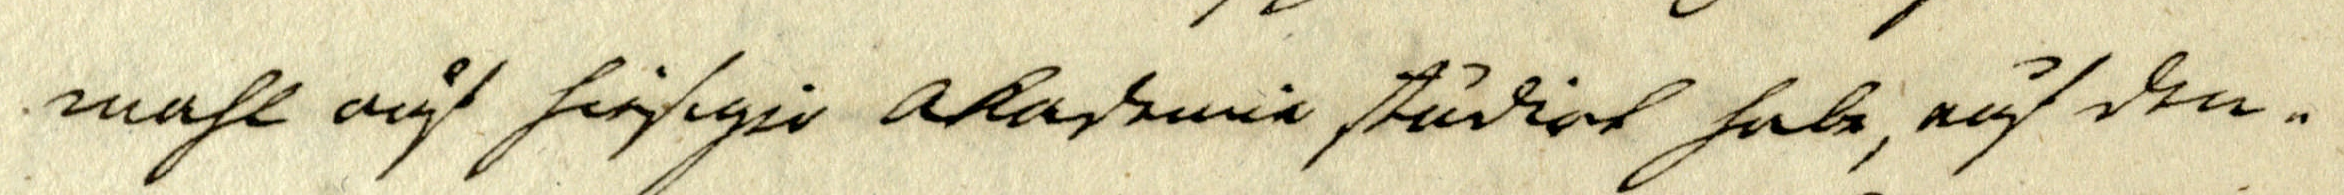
mahl auf hiesiger Akademie studirt habe, auf den¬
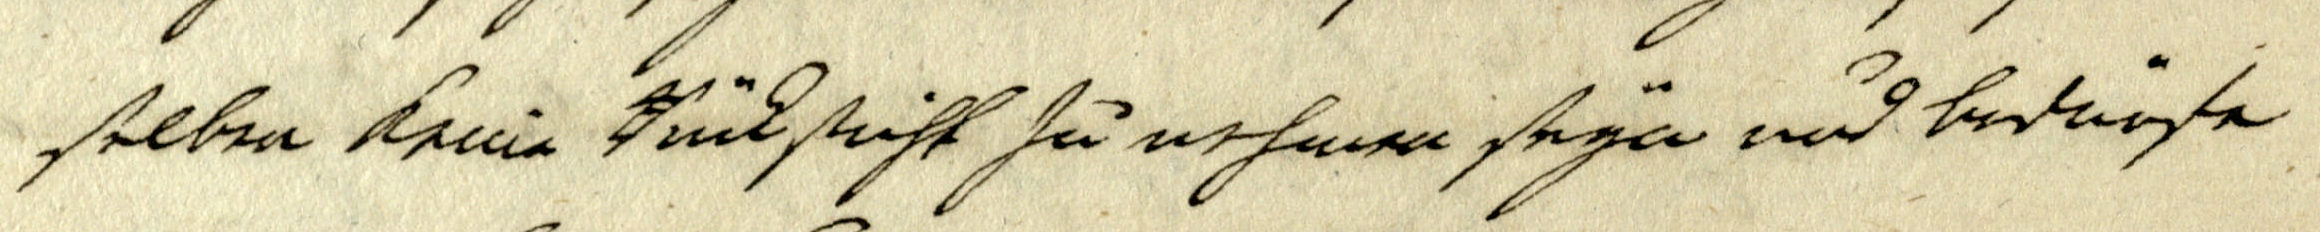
selben keineRücksicht zu nehmen seÿn und bedürfe
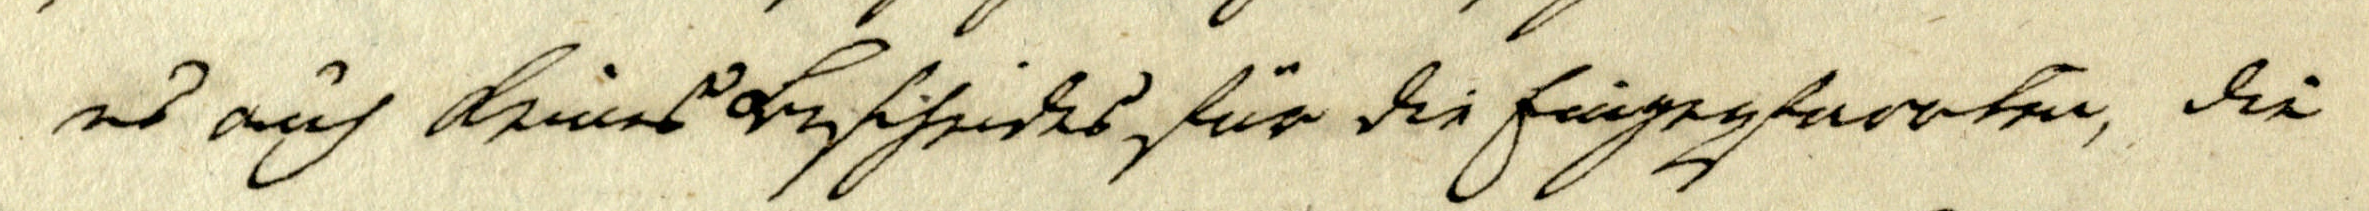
es auch keines Bescheides für die Eingepfarrten, die
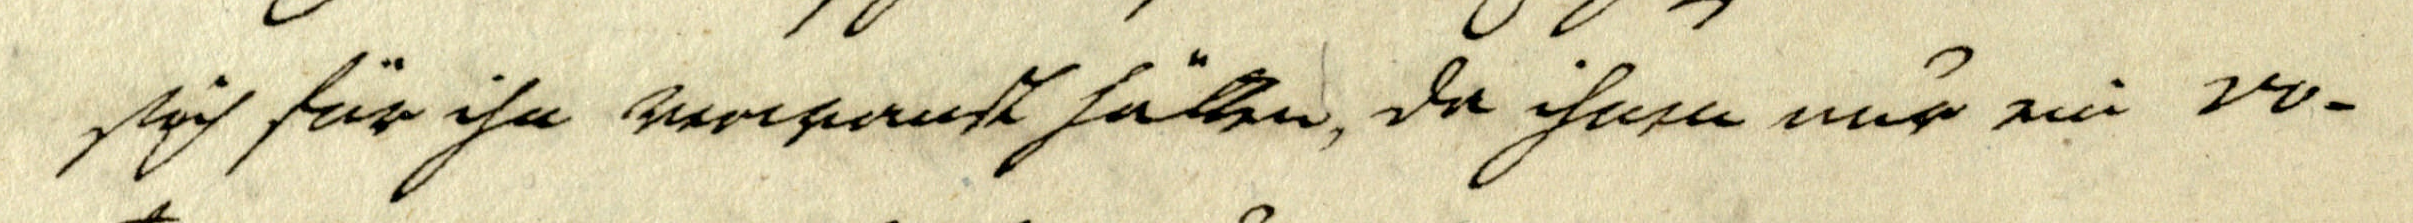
sich für ihn verwandt hätten, da ihnen nur ein vo¬
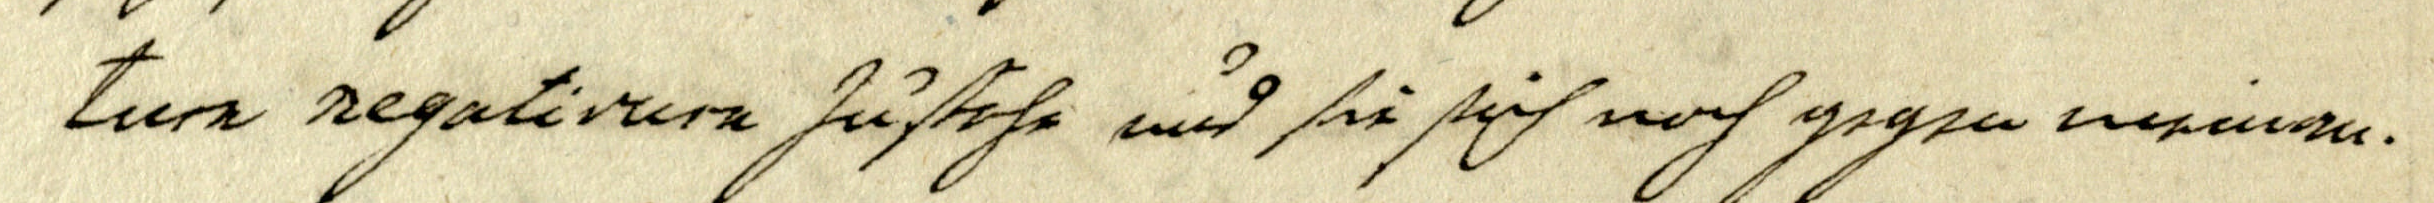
tum negativum zustehe und sie sich noch gegen
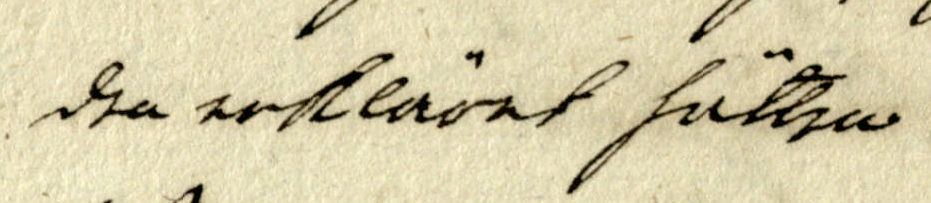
den erkläret hätten.
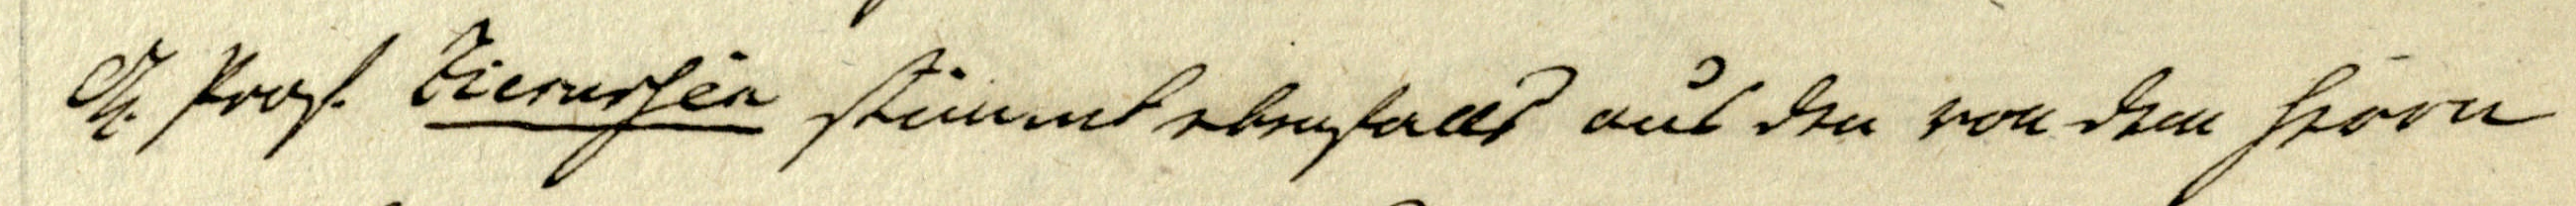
dh. Prof. Ziemssen stimmt ebenfalls aus den von dem herrn
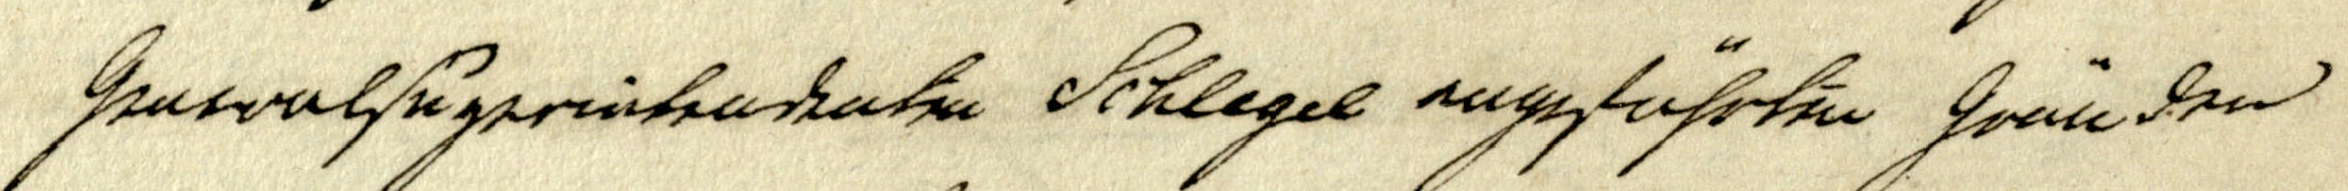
Generalsuperintendenten Schlegel angeführten Gründen
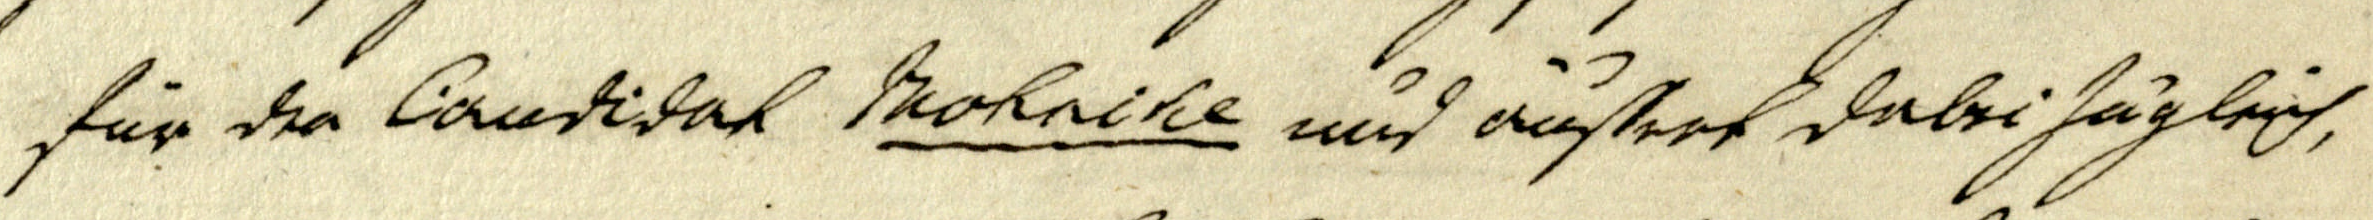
für den Candidat Mohnike und äussert dabei zugleich
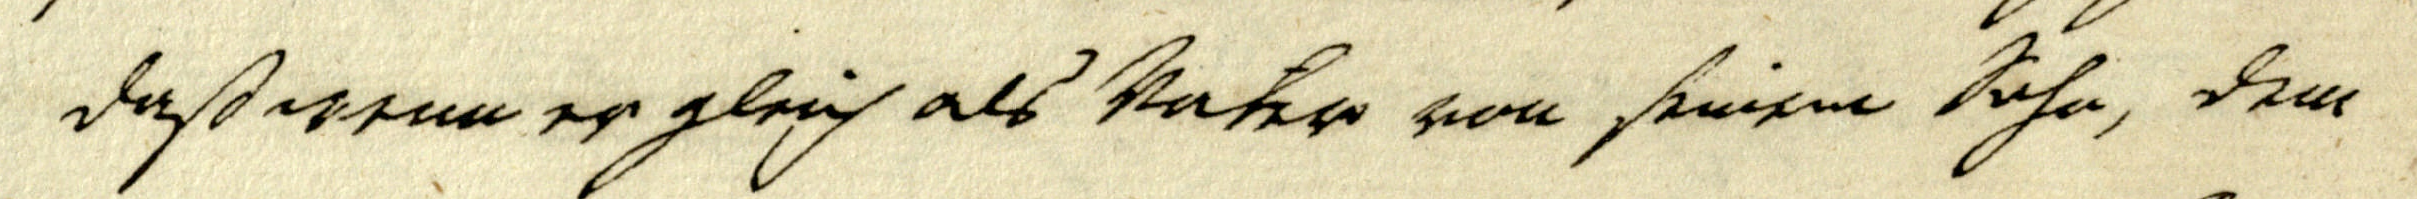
daß wenn er gleich als Vater von seinem Sohn, dem
